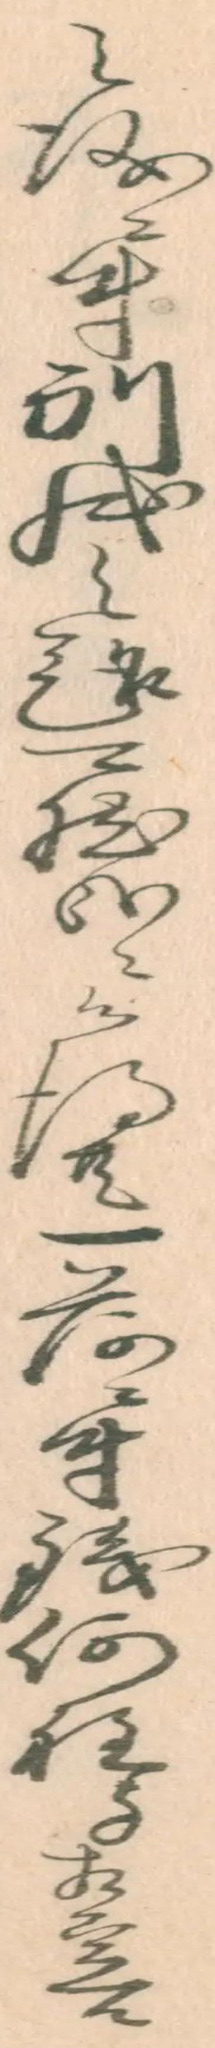之儀ニ付別紙之趣可然哉ニ候得共一荷ニ付銭何程と相定候
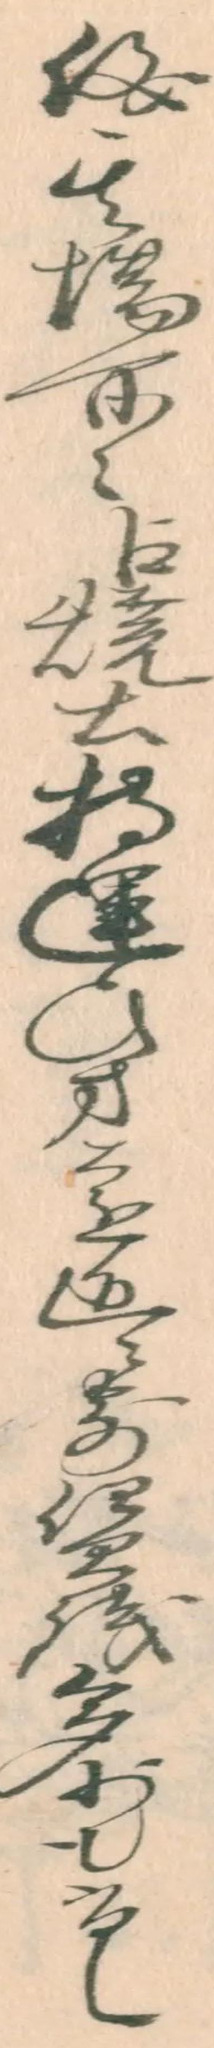儀、其場所〻え焼土持ち運ひ方遠近ニ寄賃銭多少も有之
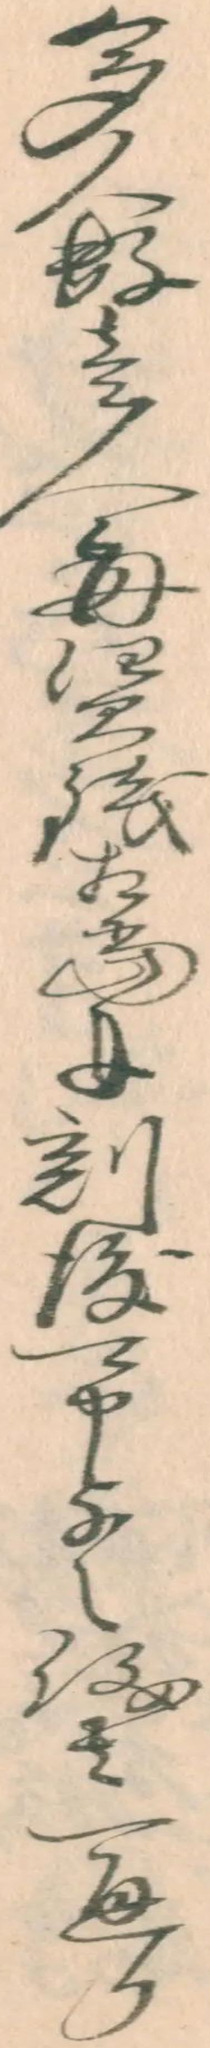多人数壱人毎賃銭相当に割渡可申と之儀は一通り
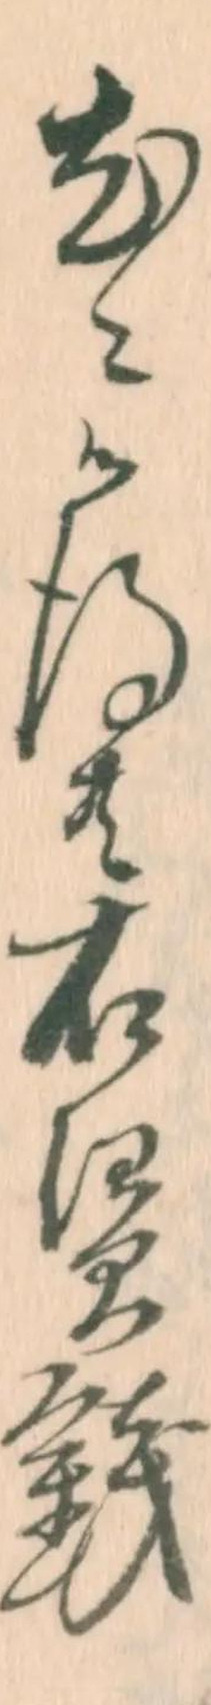尤ニ候得共右賃銭
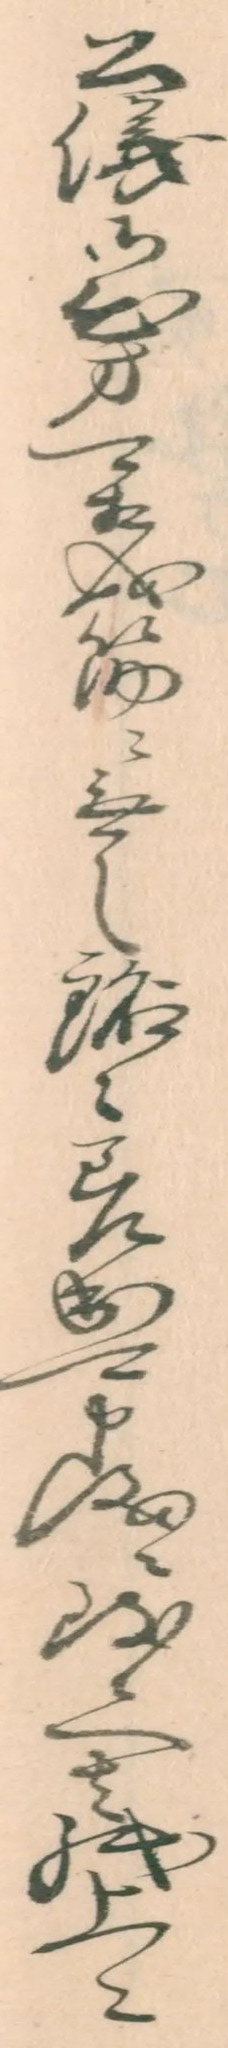公儀御出方可相成筋ニ無之銘〻差出可申儀ニ存候へは紙上ニ
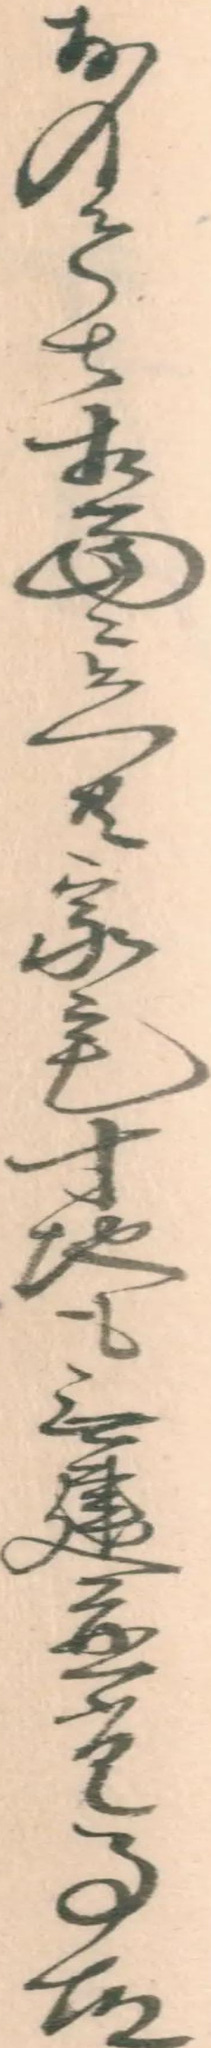おゐては相当ニ候へ共家宅寸地も無建並有之事故
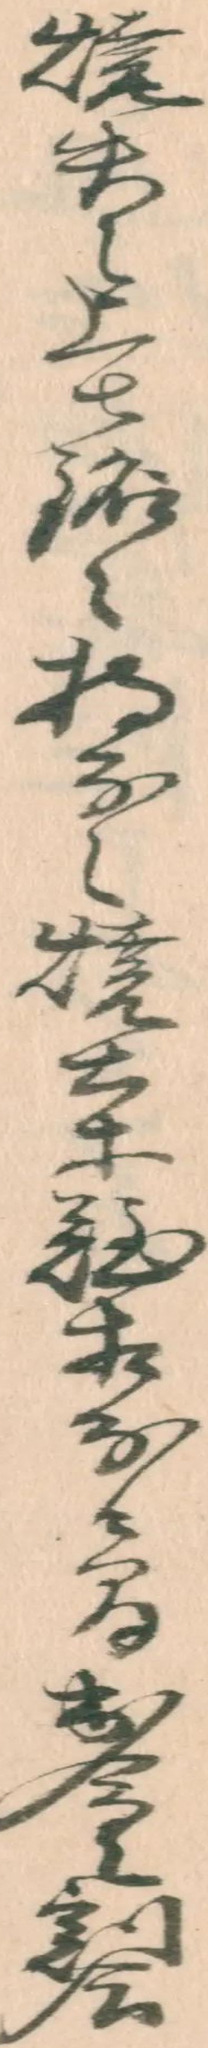焼失之上は銘〻持分之焼土等難相分候間出金之割合
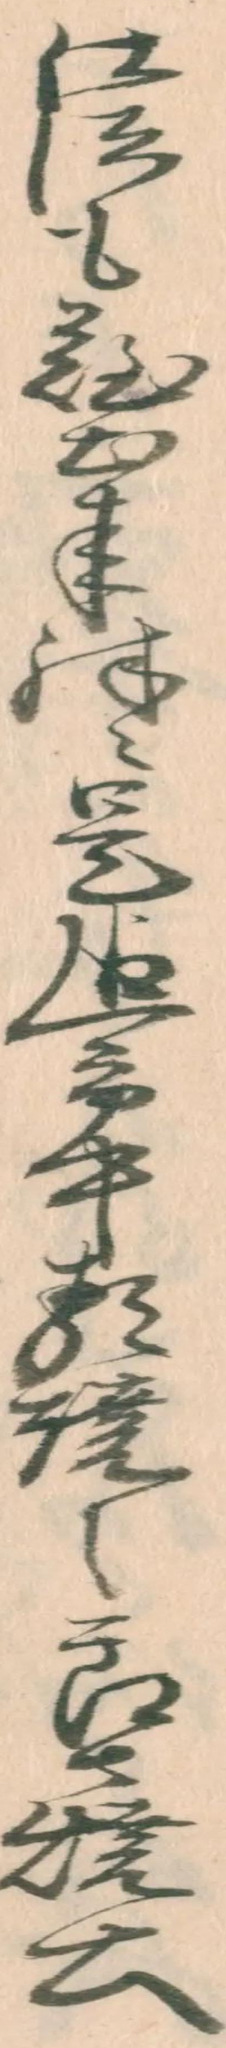仕法も難出来殊ニ是迄市中類焼之節は焼土
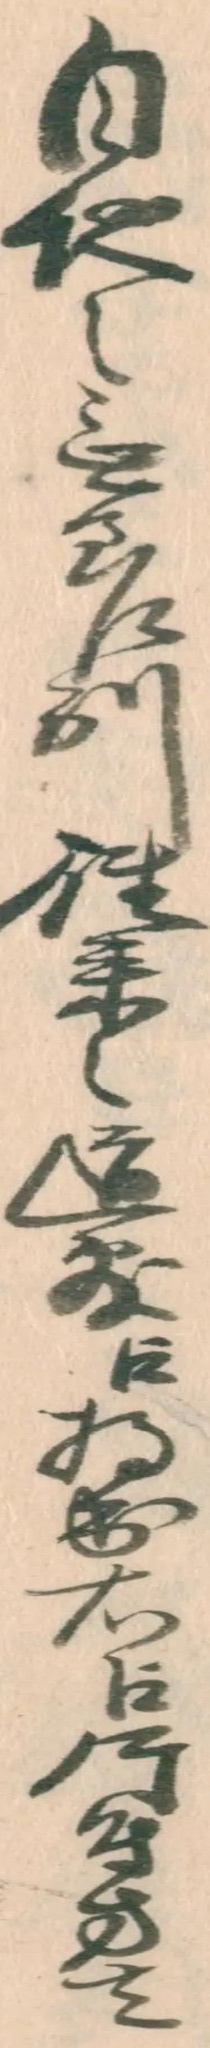自他之無差別往来之道敷え持出右え片付方は
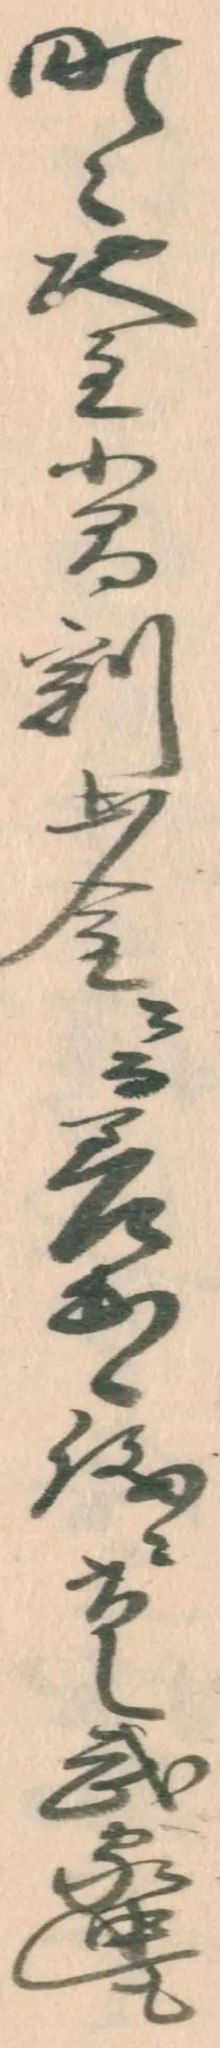町〻地主小間割出金ニて差出候儀ニ有之武家迚も
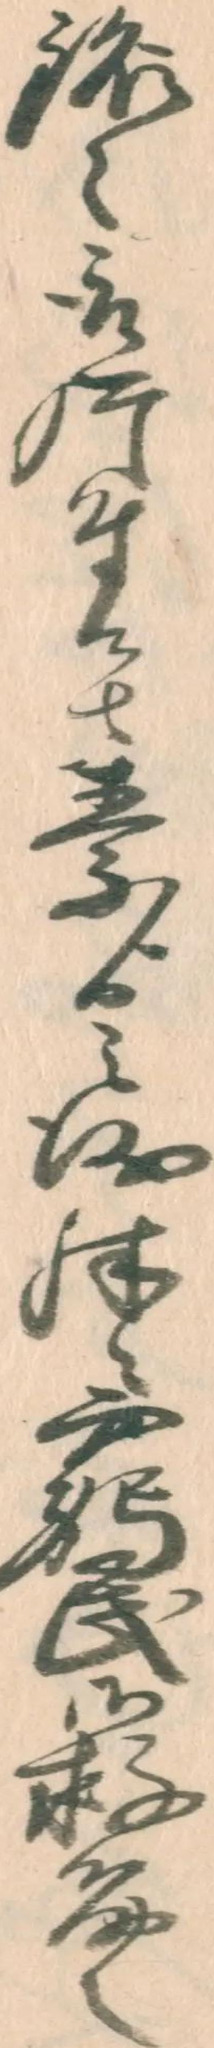銘〻取片付候は素ゟの儀殊ニ窮民御救筋之
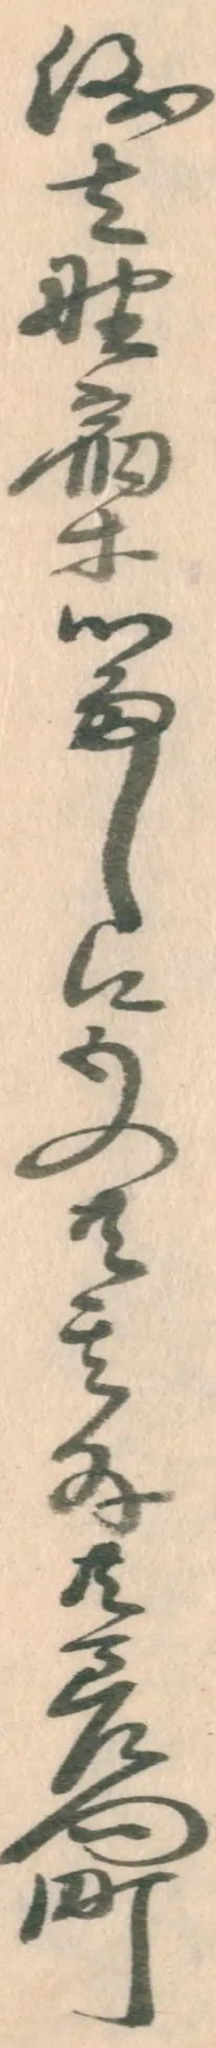儀は野宿等いたし候もの共其外共差向町
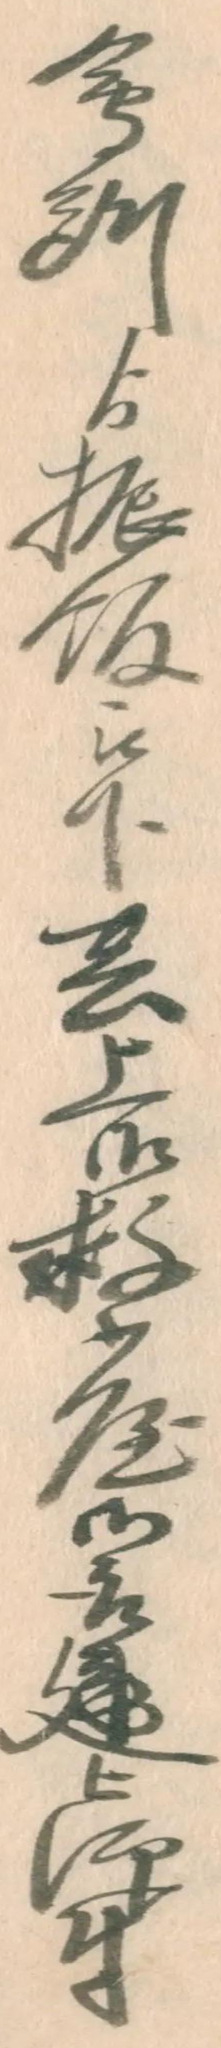会所ゟ握飯被下其上御救小屋御取建被仰付

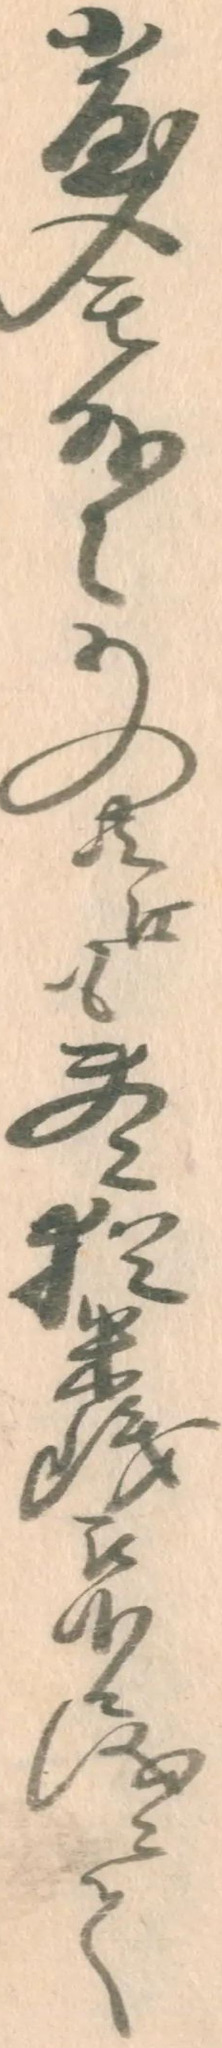小屋入其外之もの共えも夫〻猶米銭被下候儀ニて
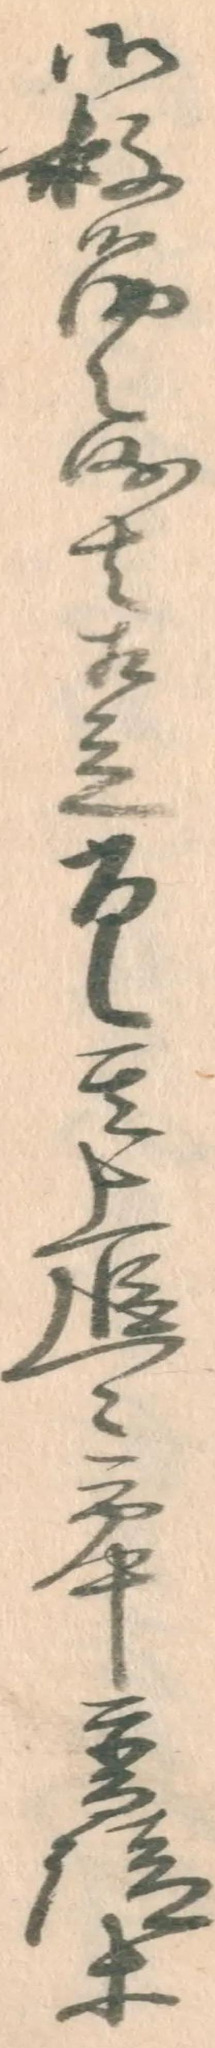御救筋之儀は相立有之其上追〻市中普請等
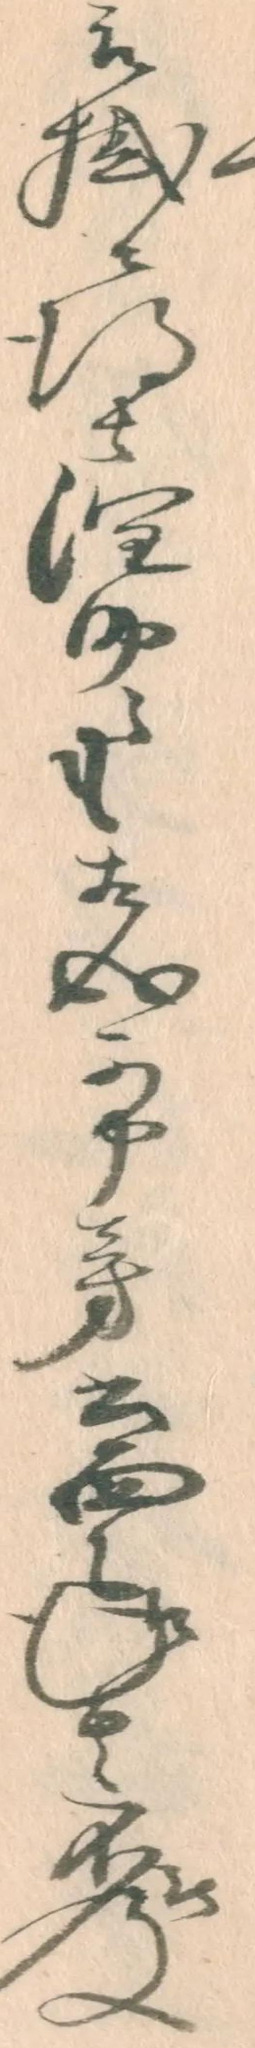取掛候得は潤助ニも相成可申旁書面之趣は不被及
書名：地震災書留 2巻. [2] 内表紙に「地震一件　安政二卯年十月」とあり
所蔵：国立国会図書館 National Diet Library, JAPAN
